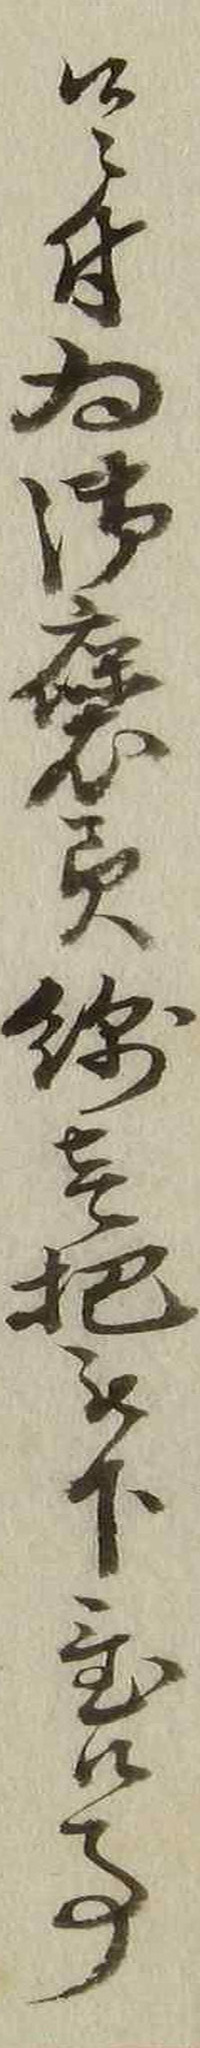候ニ付為御褒美綿壱把被下置候事
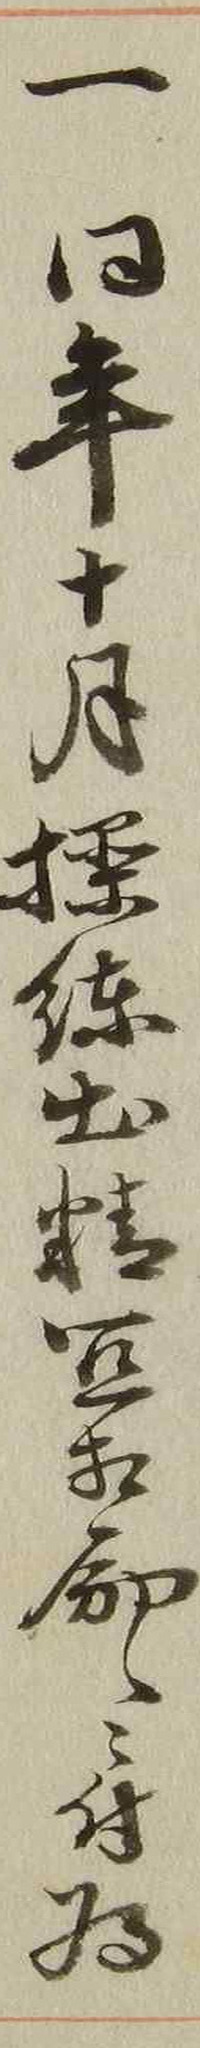一同年十月操練出精宜相励候ニ付為
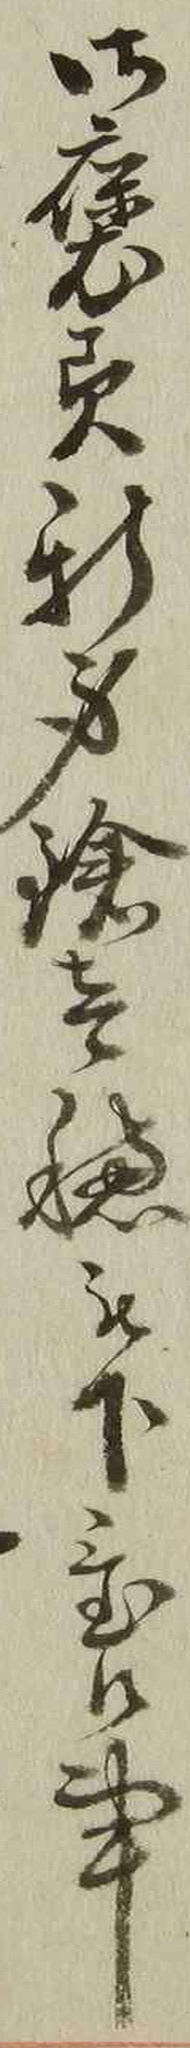御褒美新身鎗壱穂被下置候事
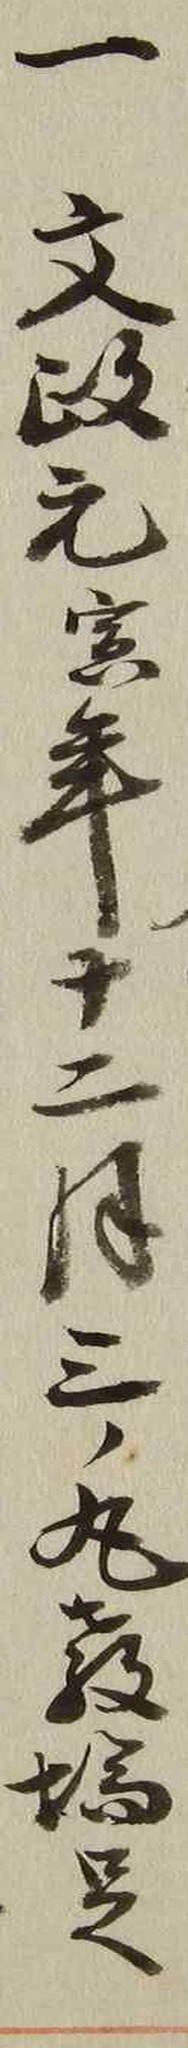一文政元寅年十二月三ノ丸教場足
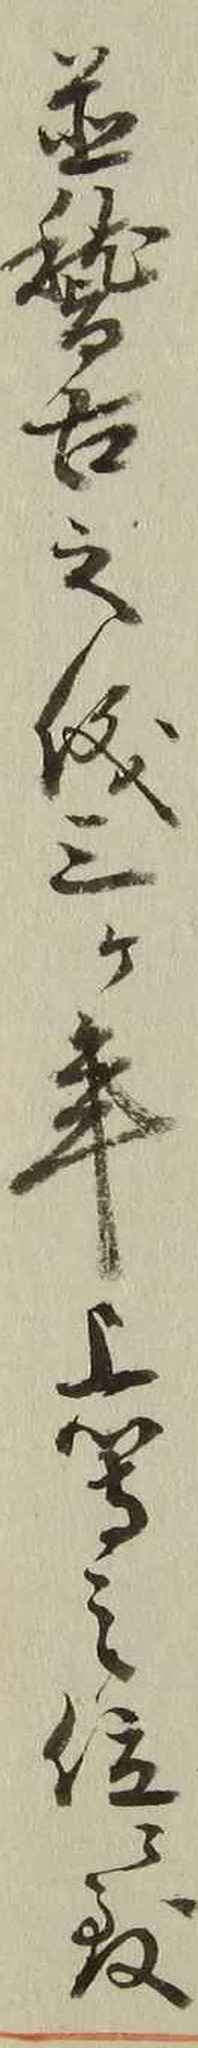並稽之儀三ケ年上等之位ニ致
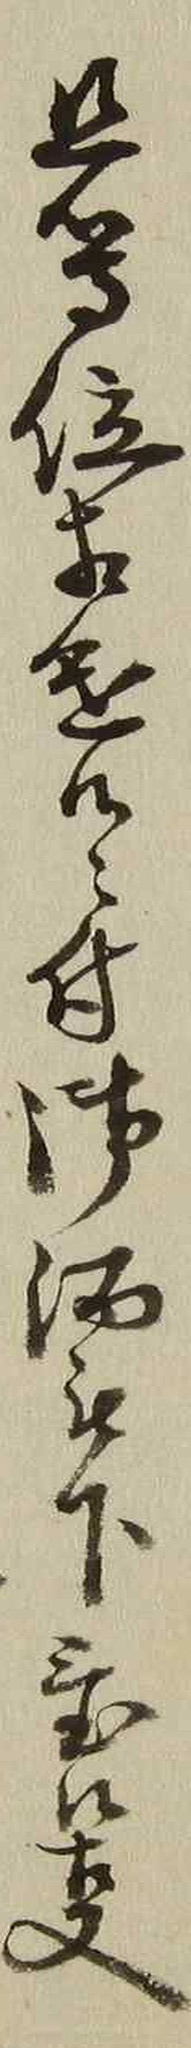且等位相遣候ニ付御酒被下置候事
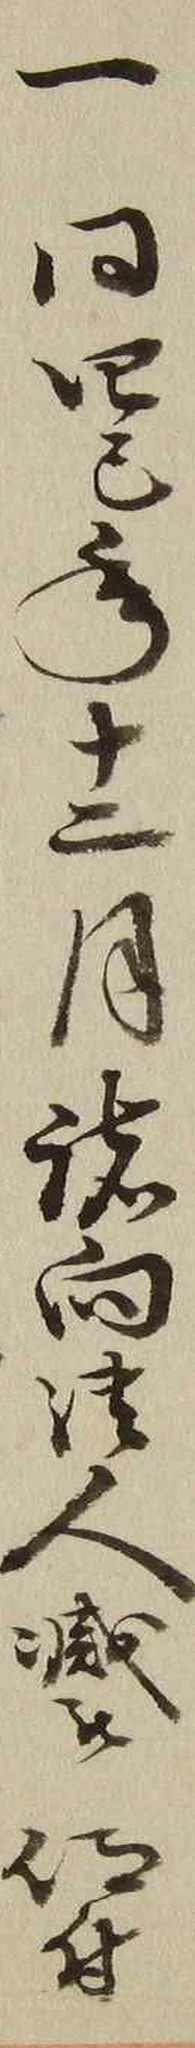一同四巳年十二月諸向御人減被仰付
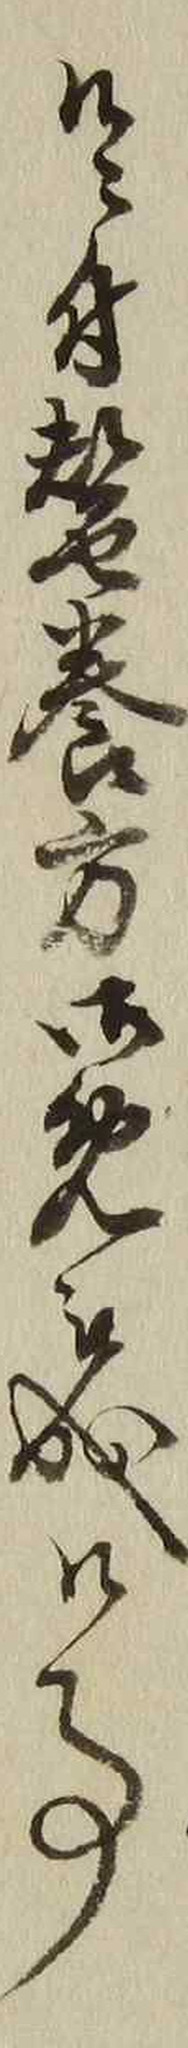候ニ付蚕養方御免被成候事
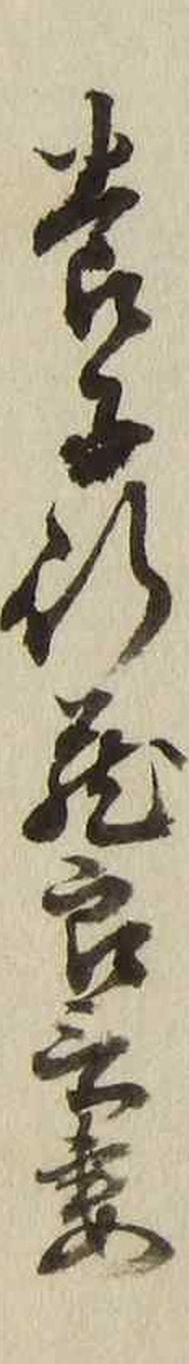養子行蔵良言妻

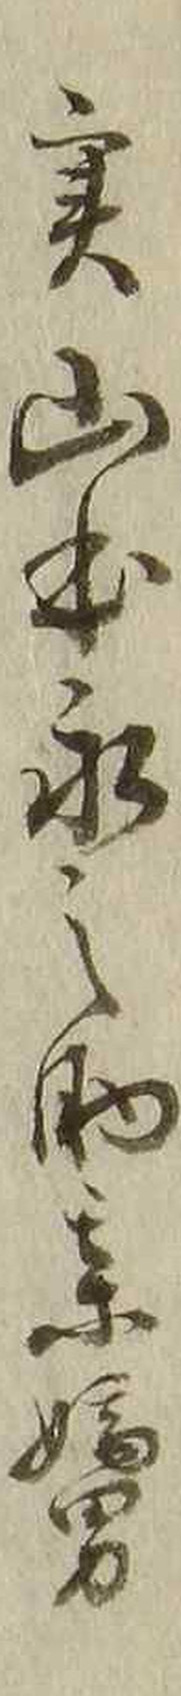実山本栄之助某嫡男
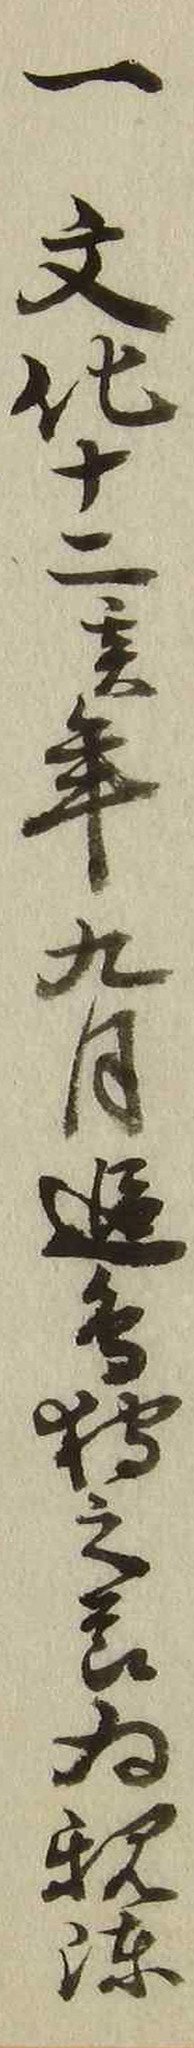一文化十二亥年九月追鳥狩之節為親陣
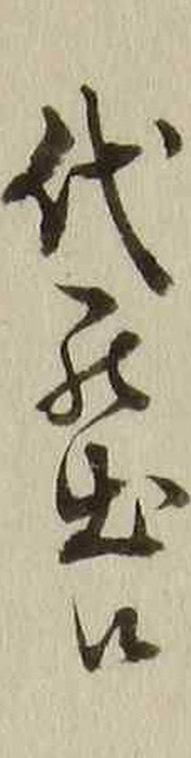代罷出候
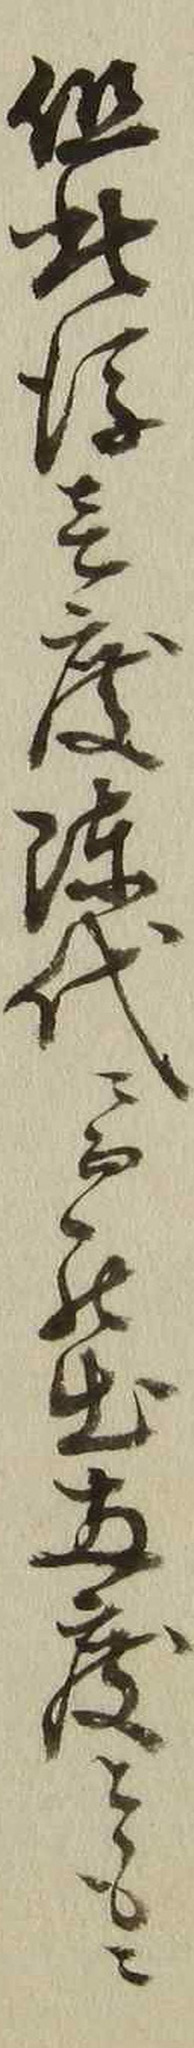但此後壱度陣代ニ而罷出両度ともニ
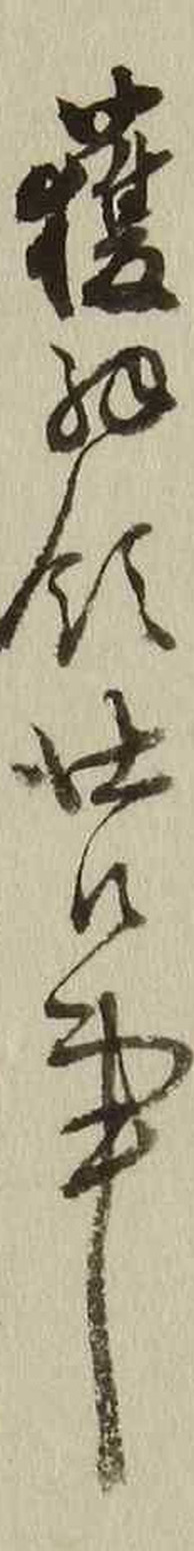獲拝領仕候事
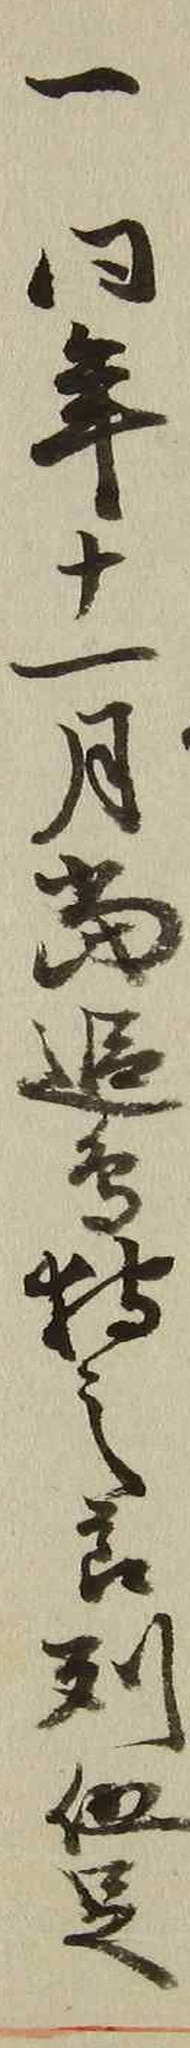一同年十一月当追鳥狩之節列伍足
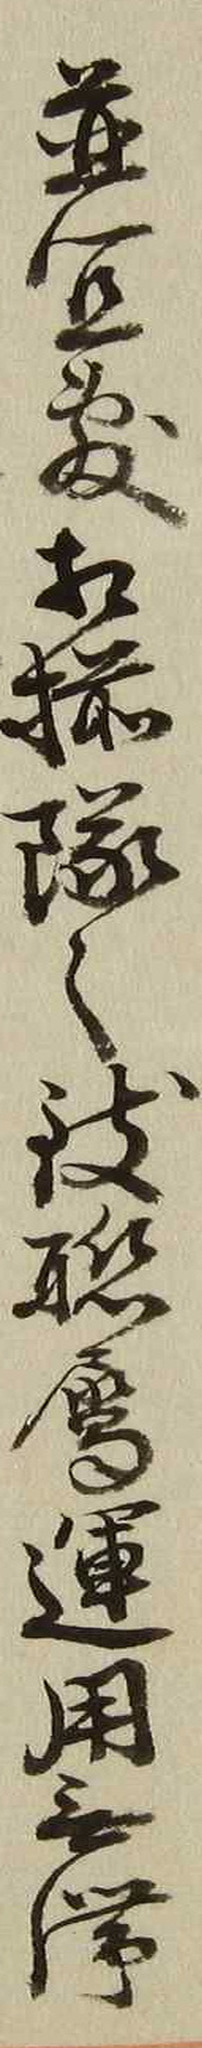並宜敷相揃隊々致聯属運用無滞
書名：諸士系譜　巻之31　い之部31
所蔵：会津若松市立会津図書館
